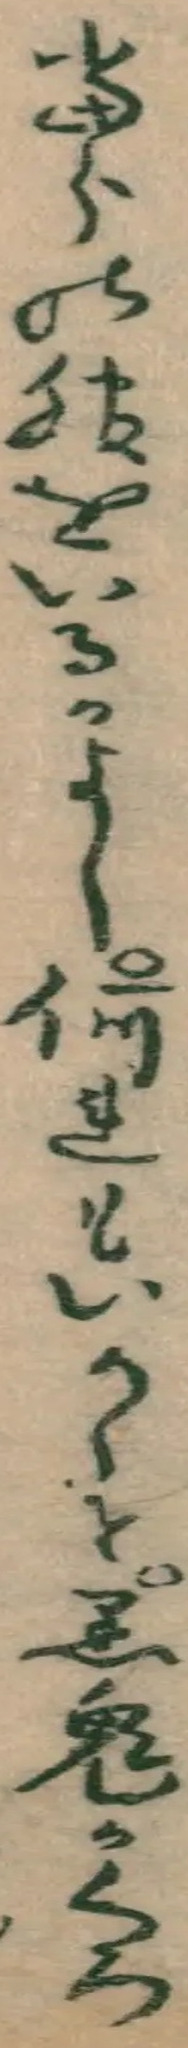当分の腹をいるかよし。何れもいかゝと。黒鬼かくろ
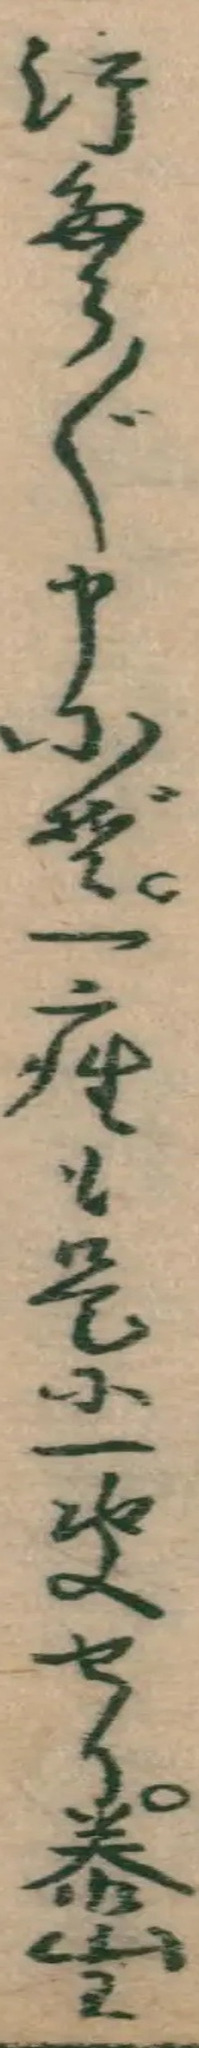汗たら〴〵申にぞ。一座も是に一決せり。泰山王
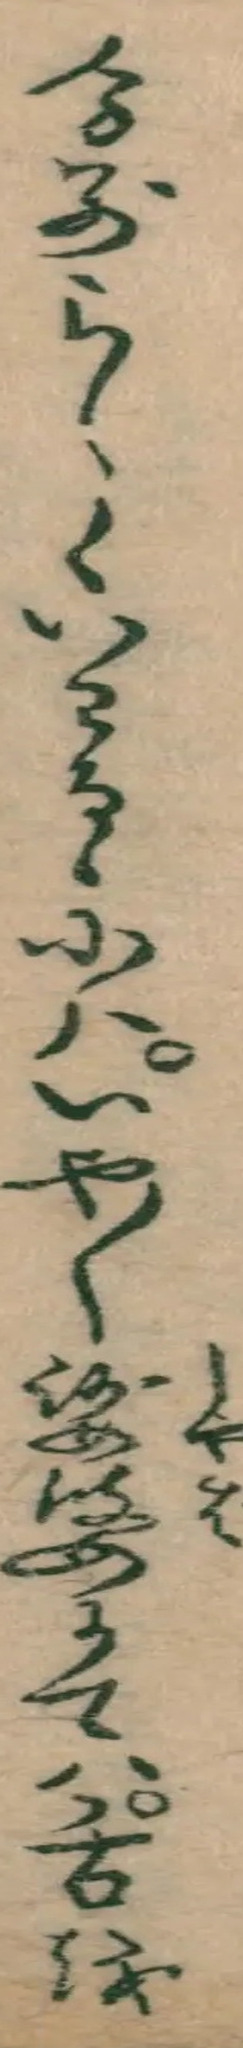分別らしくいわるゝには。いや〳〵娑婆にては。舌を
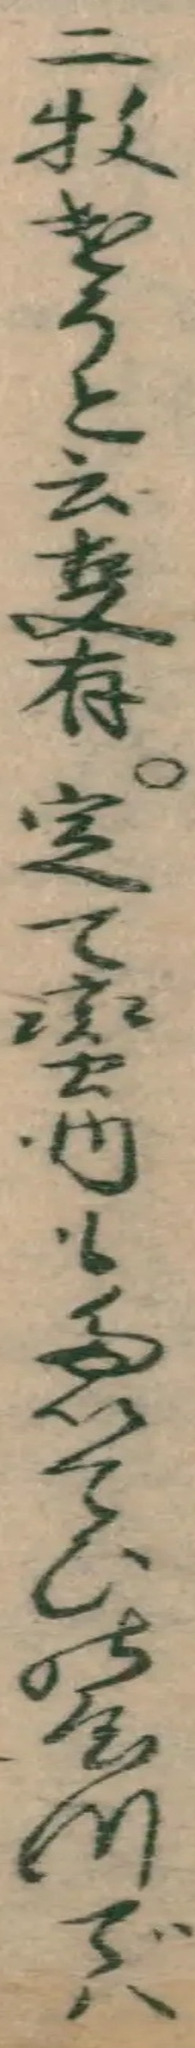二枚遣うと云事有。定て蛮内もたいてひのやつでは
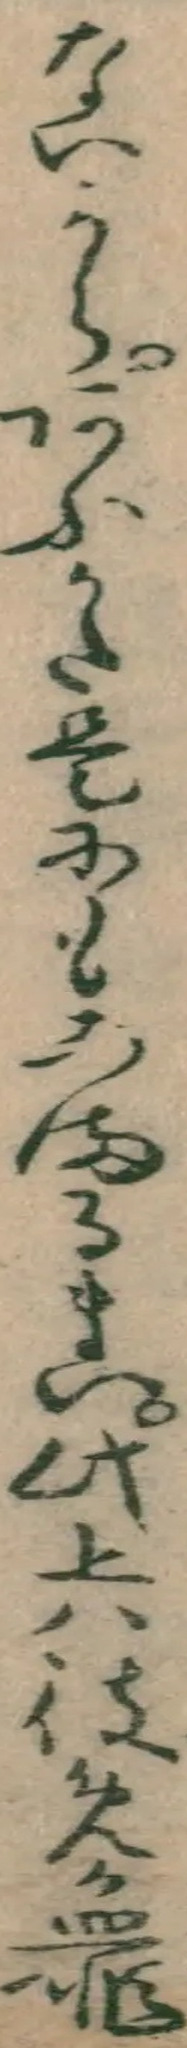ないから。あふかた是もこまるまい。此上は彼めか罪
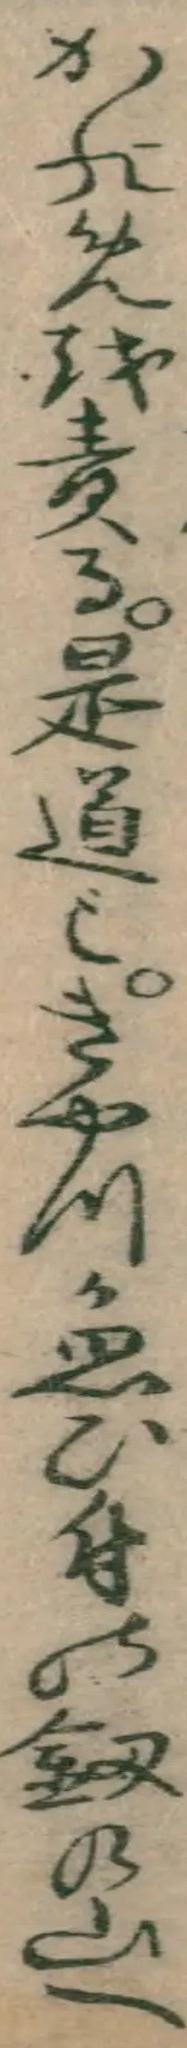かれめを責る。是道也。きやつか思ひ付の釼の山へ。
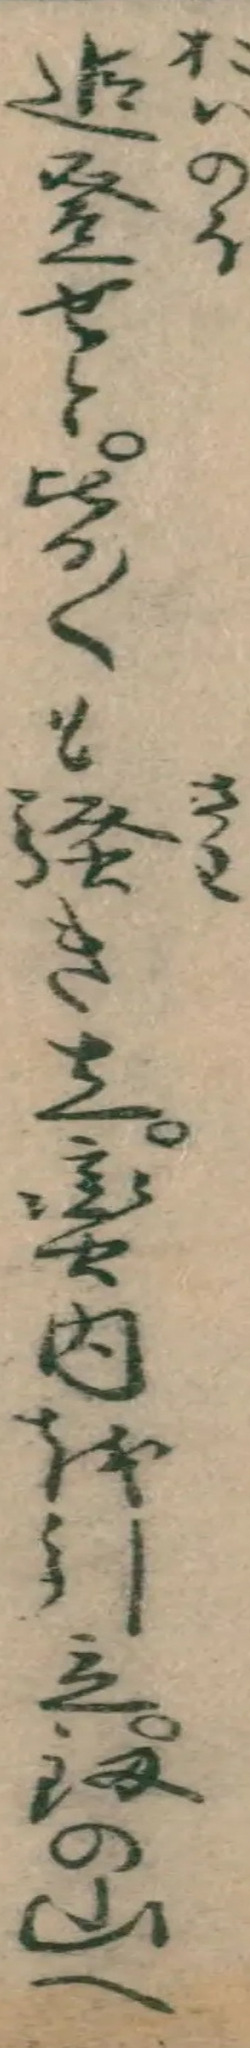追登せと。皆〳〵も騒き立。蛮内を引立。釼の山へ
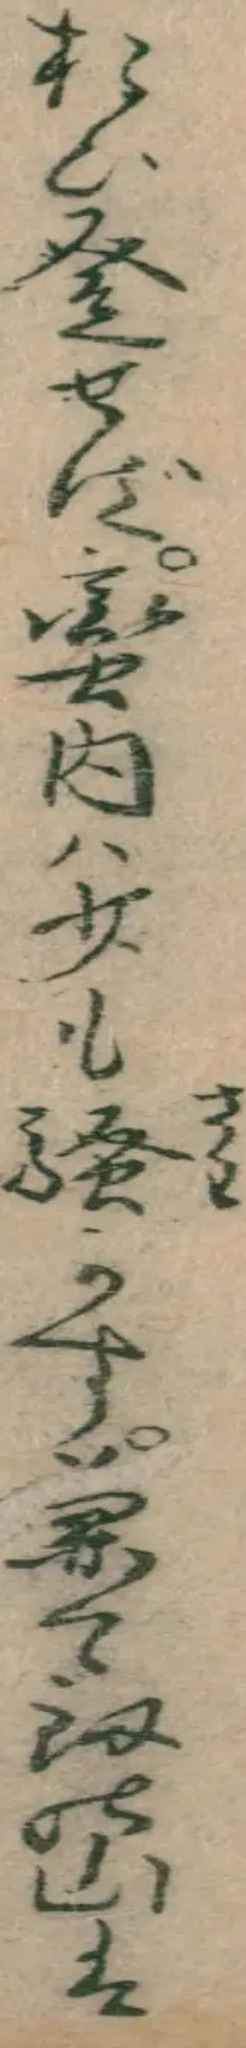おひ登せば。蛮内は少も騒かす。兼て釼の山は
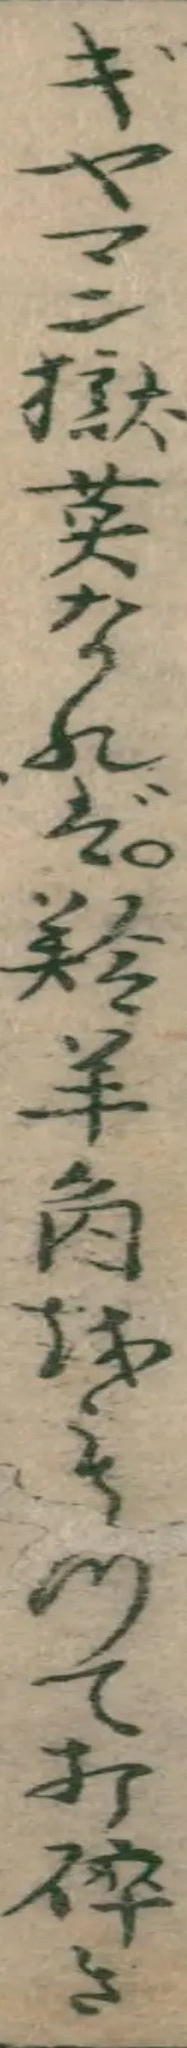ギヤマン獄英なれば。羚羊角をもつて打砕き
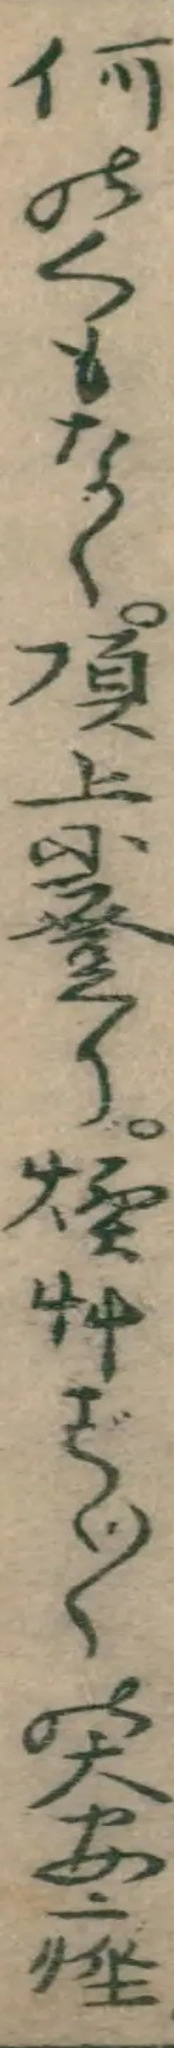何のくもなく。頂上に登り。煙草ばく〳〵の大安座。
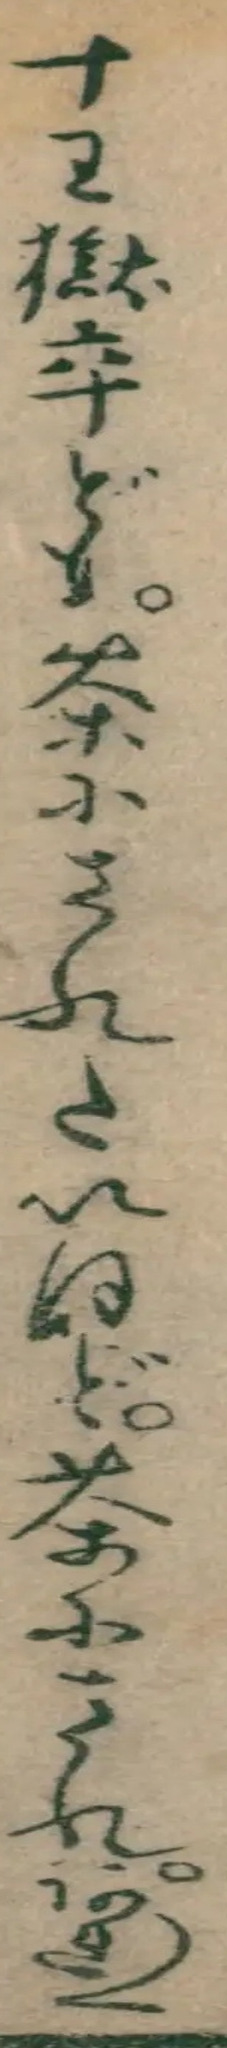十王獄卒ども。茶にされたいほど。茶にされ。あれ〳〵

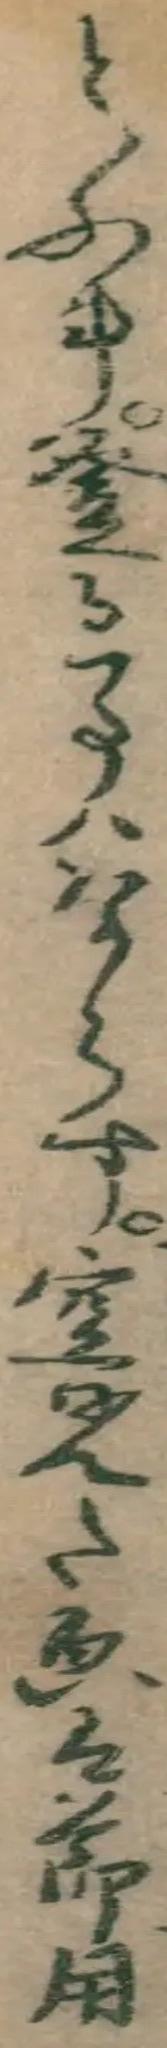とふ事。登る事はならず。空見た皃は節用
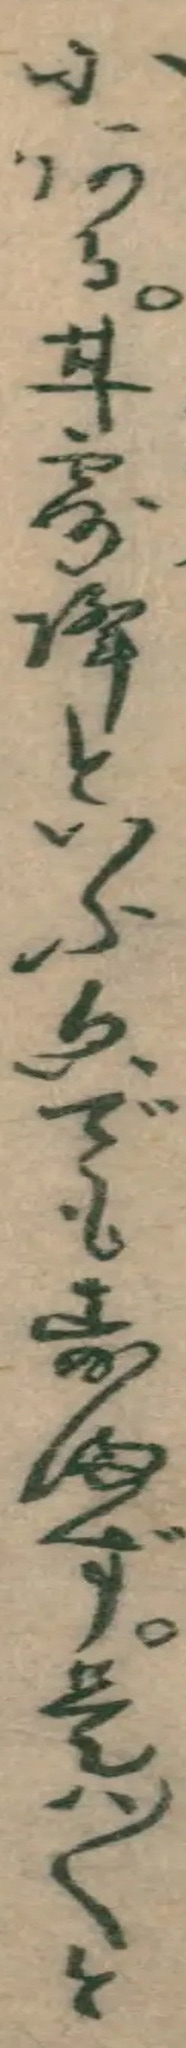にある。甘露降といふ皃でもすまず。是は〳〵と
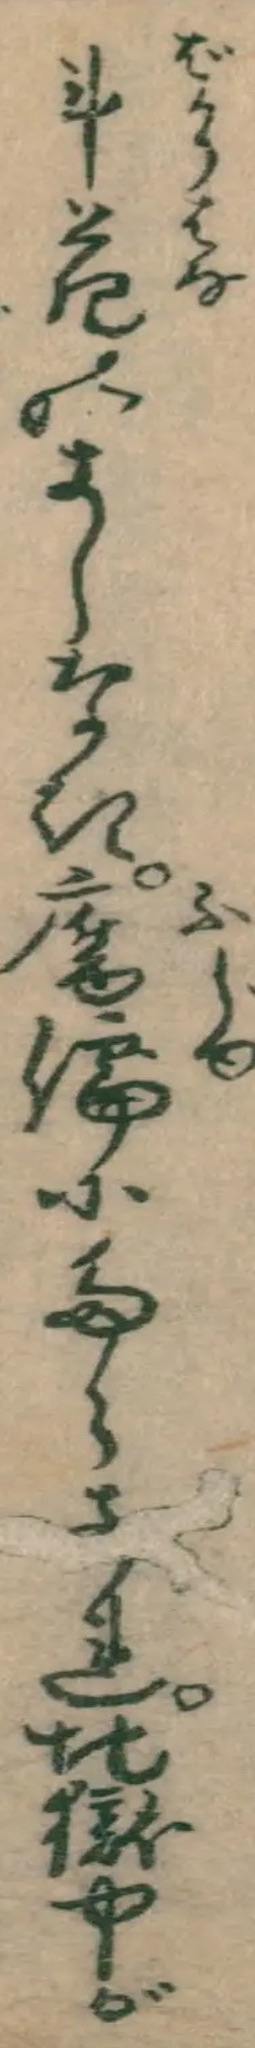斗花のよしなき。腐儒にたられ。地獄中が
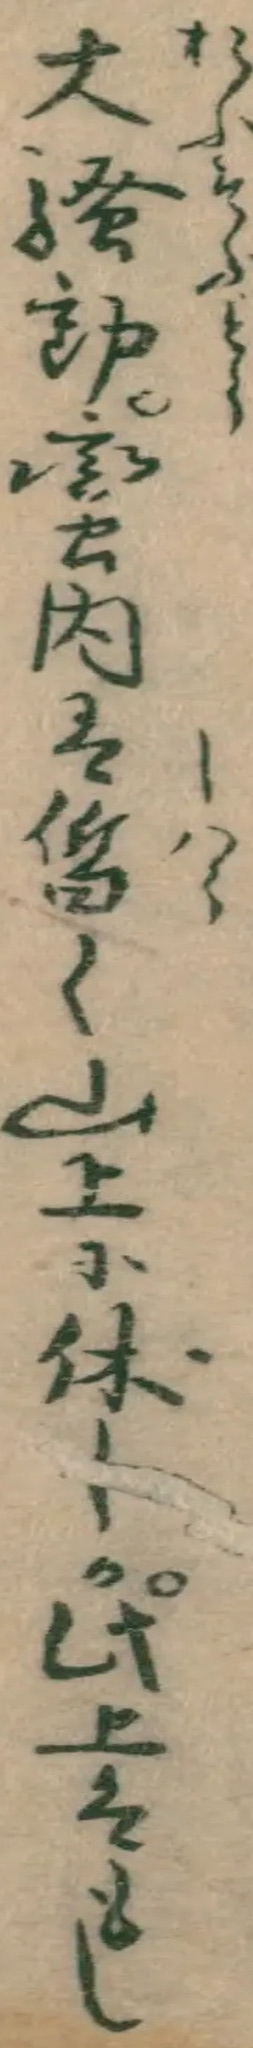大騒動。蛮内は暫く山上に休し。此上はもし
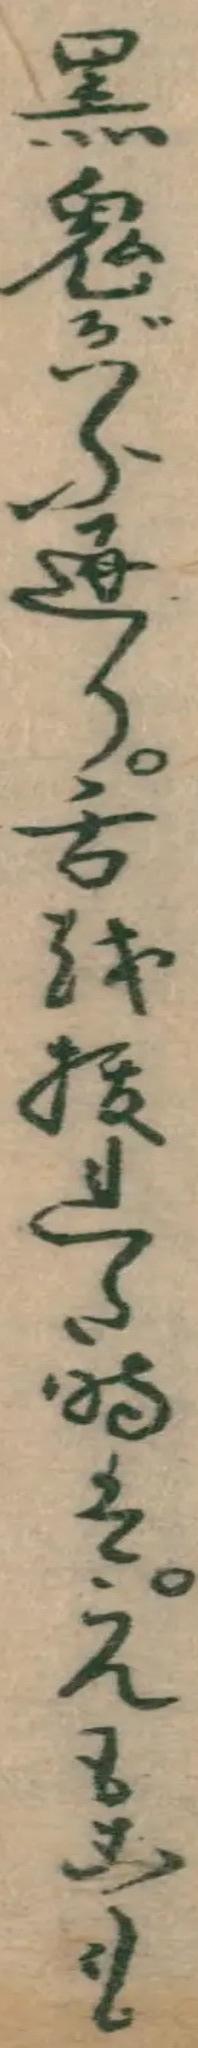黒鬼がいふ通り。舌を抜れた時は。えもこも
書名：翻草盲目
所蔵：国立国会図書館 National Diet Library, JAPAN
